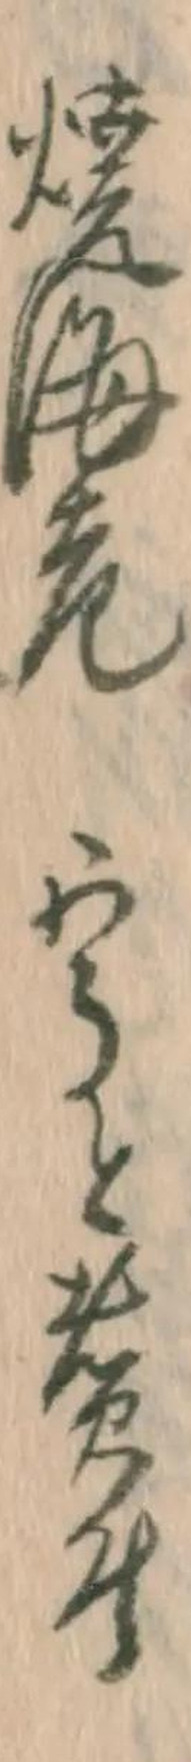焼悔老らうと煮付
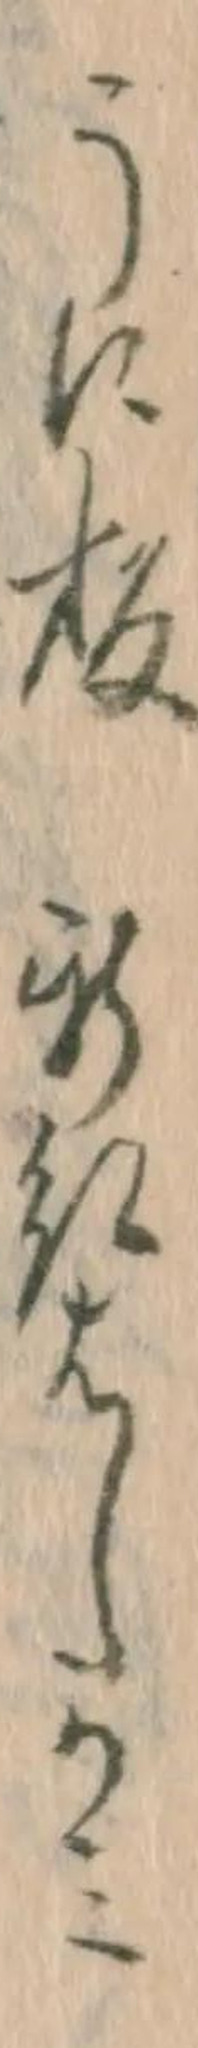うに板新紅はしかみ
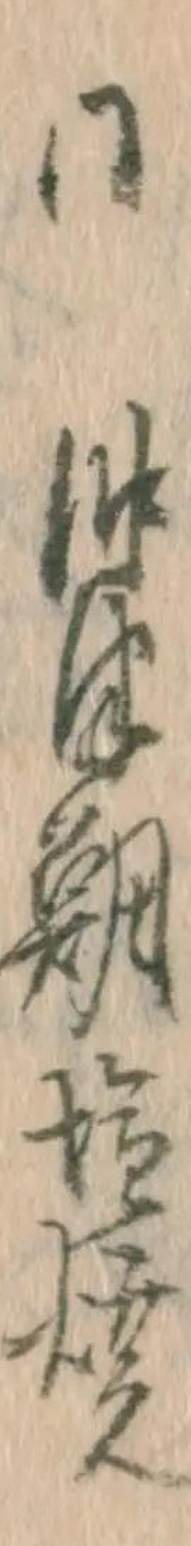同沖津鯛塩焼
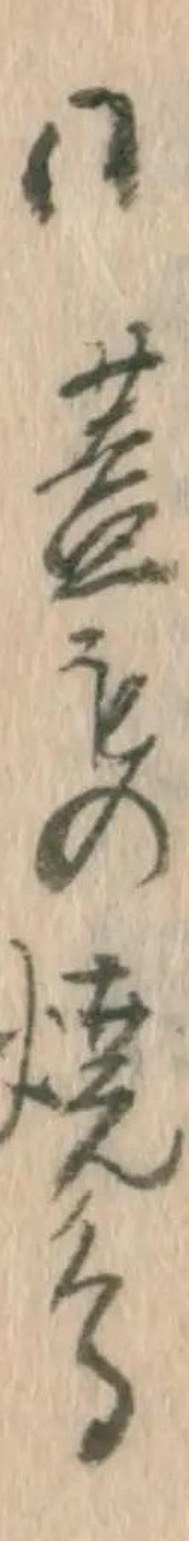同蓋もの焼鳥

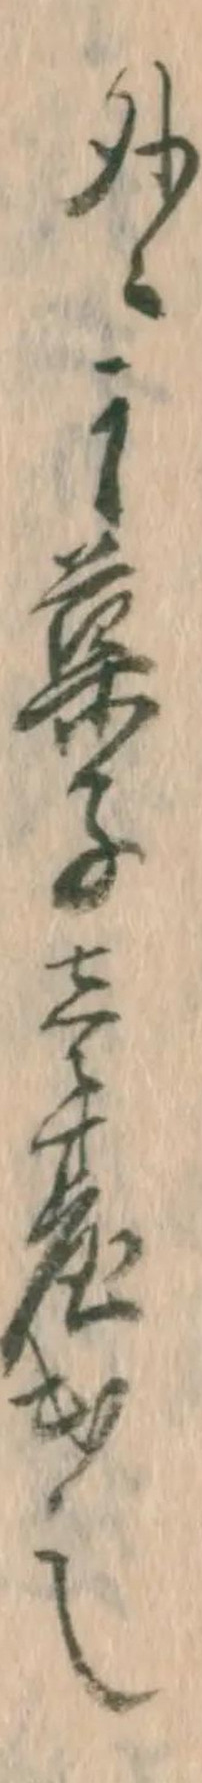外ニ干菓子壱䑓出也
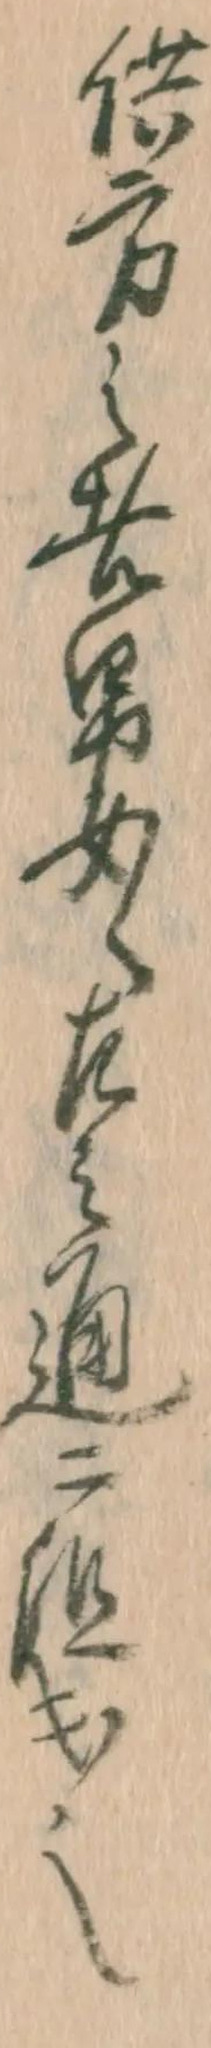供方之者男女へ左之通二組出也
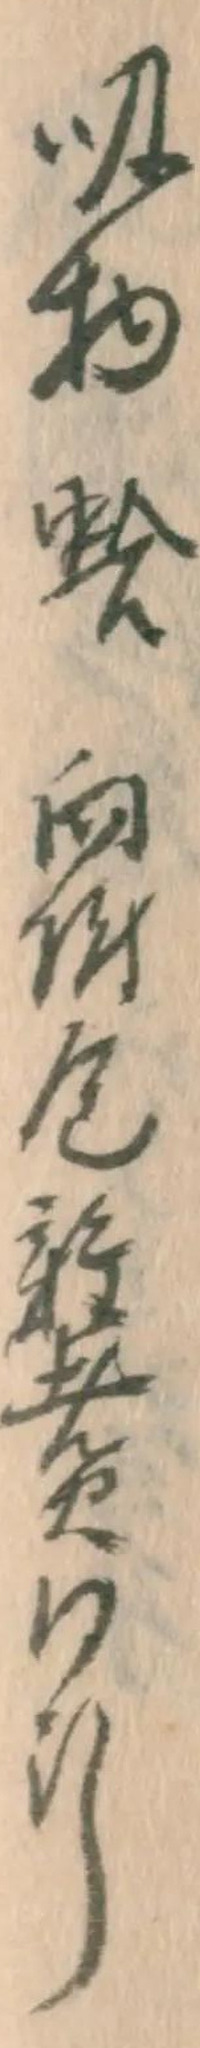吸物蛤向附包雑煮同断
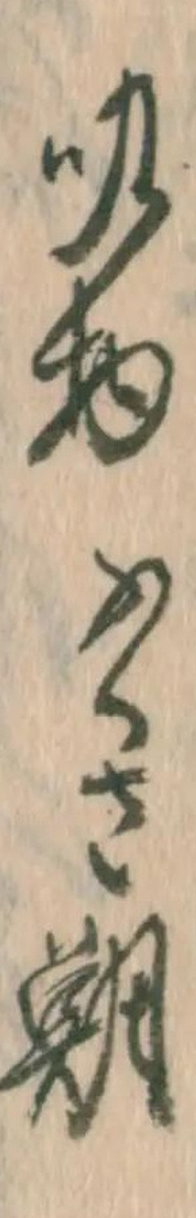吸物ふくさ鯛
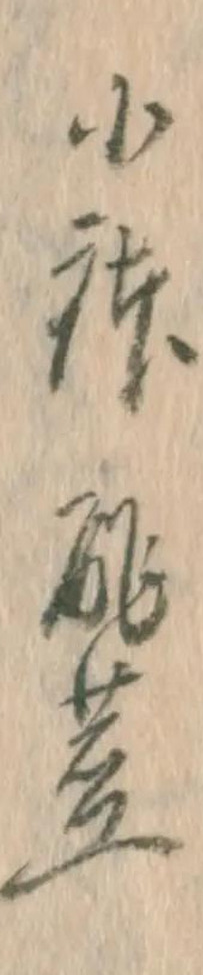小鉢酢蕪
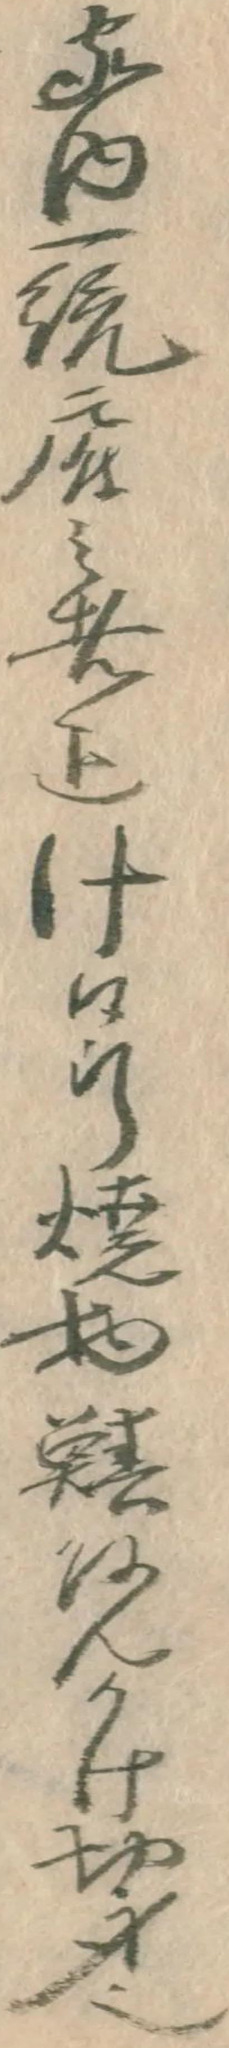家内一統肩之者迄汁同断焼物鰆あんかけ切身也
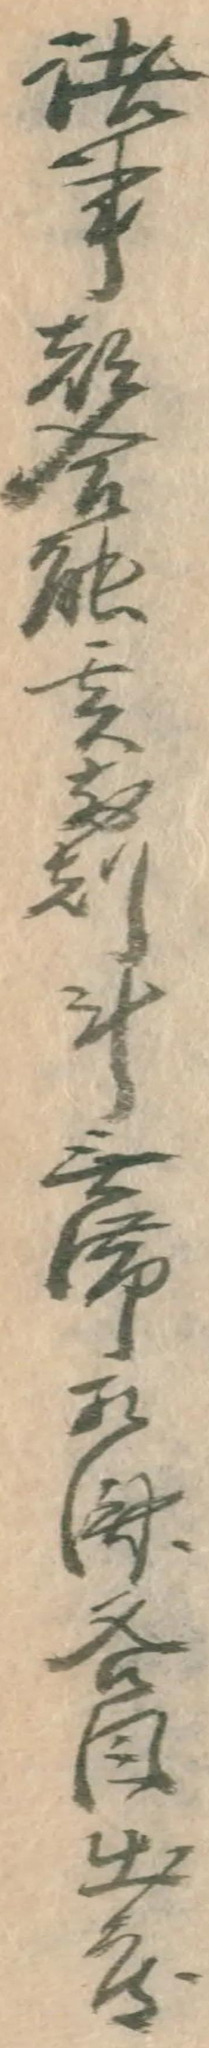諸事都合能亥前刻斗無滞相済各目出度

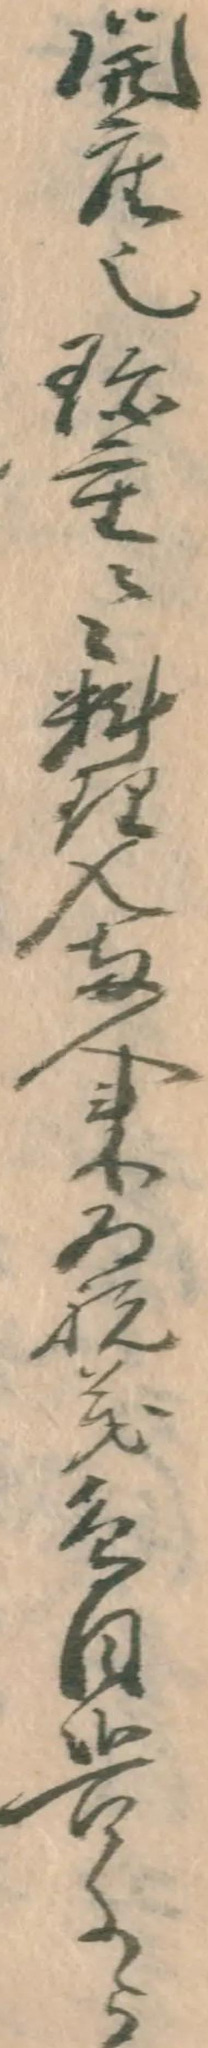開座也珍重々々料理入両人来為祝義鳥目弐百匁と
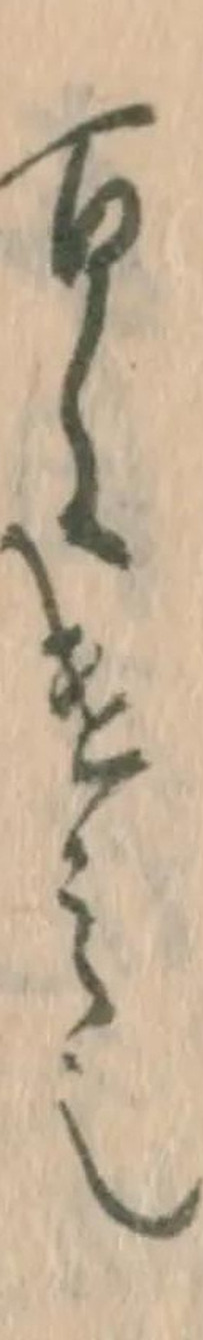百文遣之也
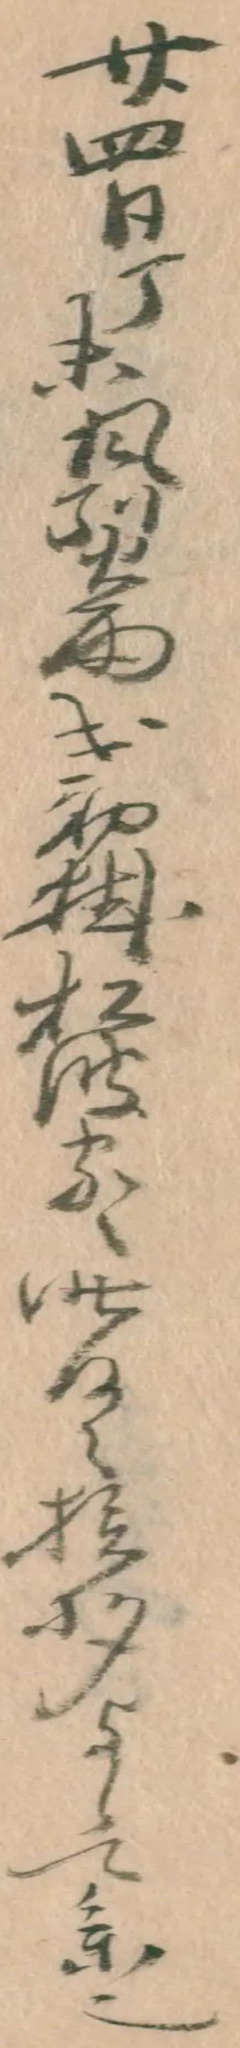廿四日丁未風烈雨出勤掛松波家へ昨日之挨拶として参也
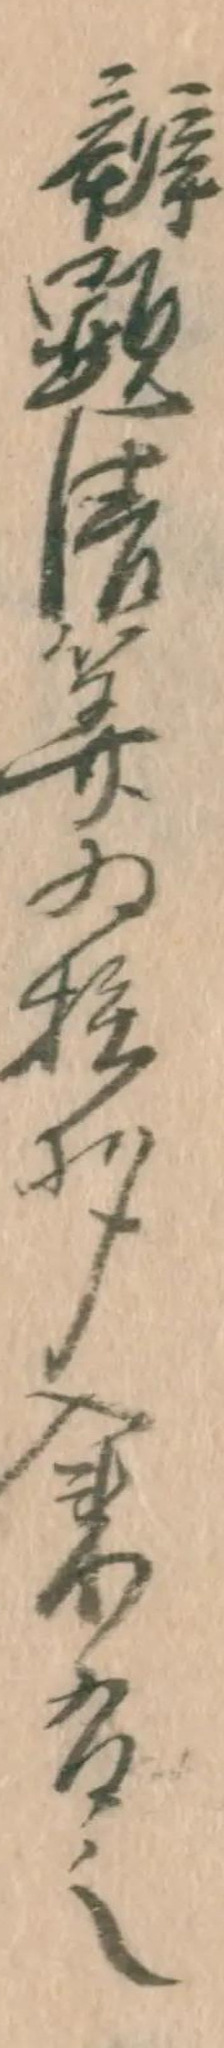辨顕清算為挨拶入来有之
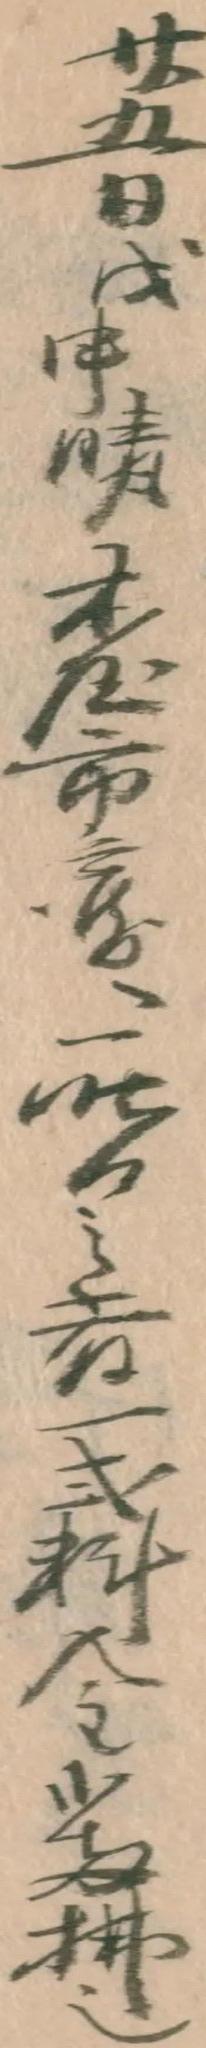廿五日戊申晴木屋市蔵へ一昨日之肴一式料金弐両払也
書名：賀茂社記録. 第67冊
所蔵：国立国会図書館 National Diet Library, JAPAN
